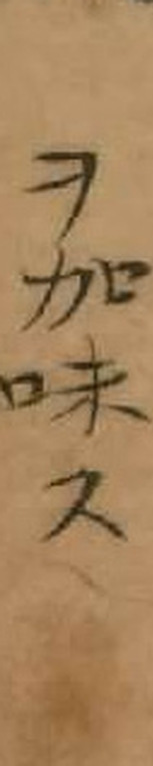ヲ加味ス
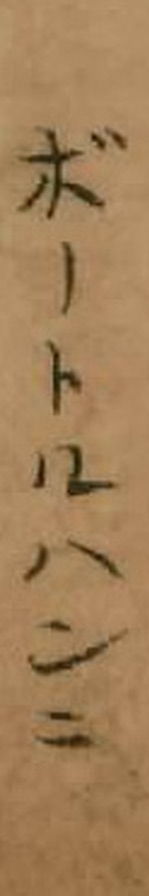ボートルハンニ
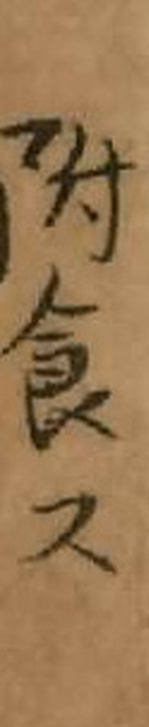附食ス
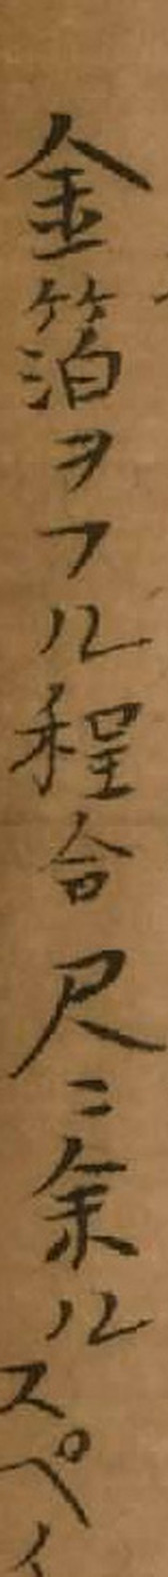金箔ヲフル程合尺ニ余ルスペイト
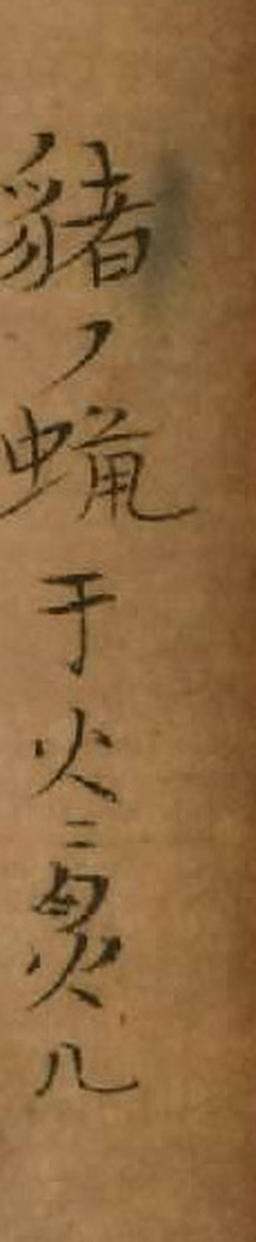猪ノ蝋于火ニ炙ル
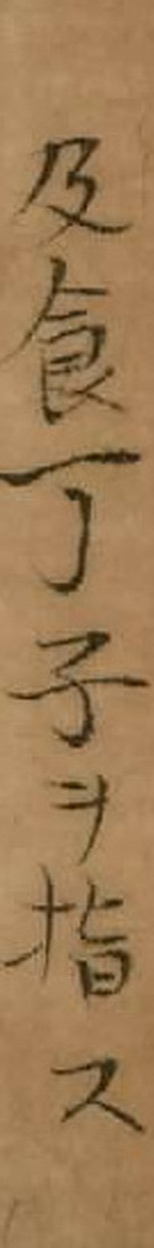及食丁子ヲ指ス
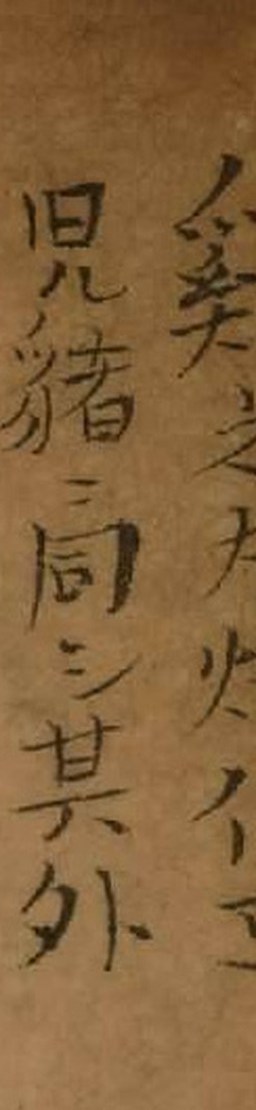児猪ニ同シ其外
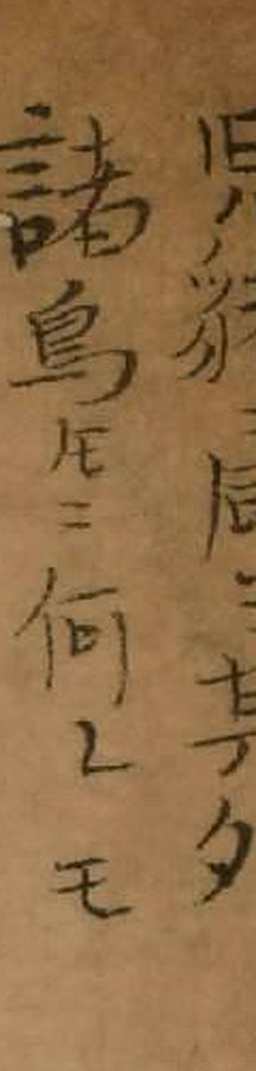諸鳥トモニ何レモ
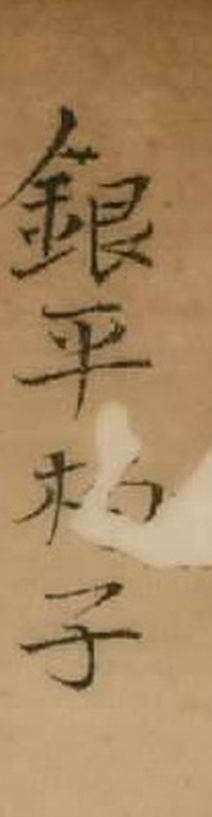銀平杓子
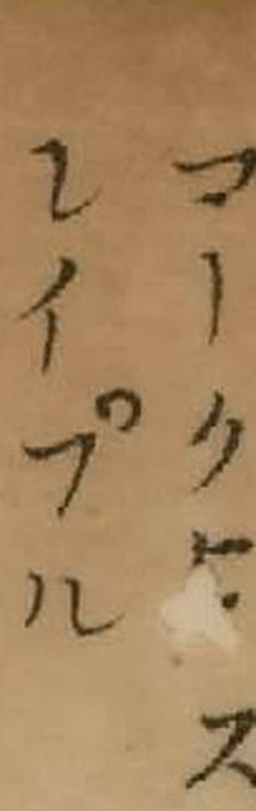レイプル

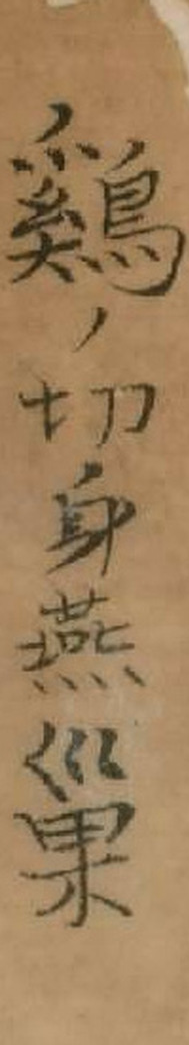鶏ノ切身燕巣
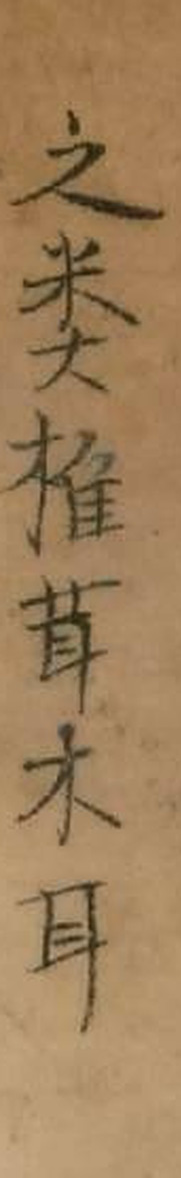之類椎茸木耳
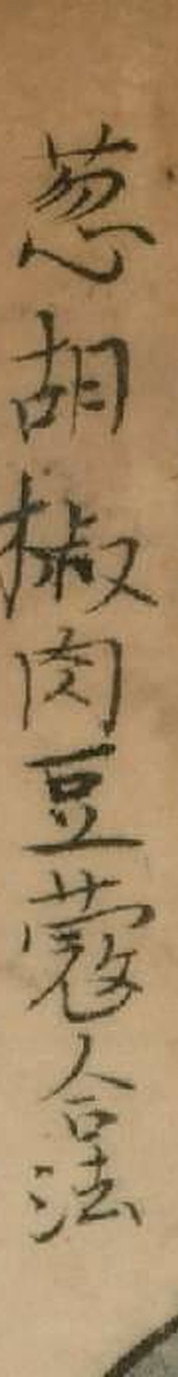葱胡椒肉豆蒄合法
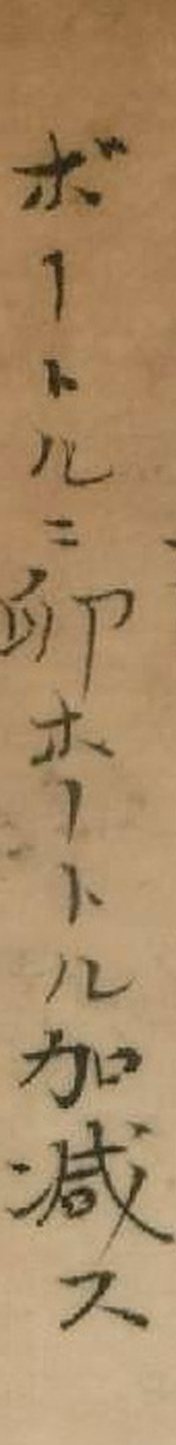ボートルニ卵ホートル加減ス
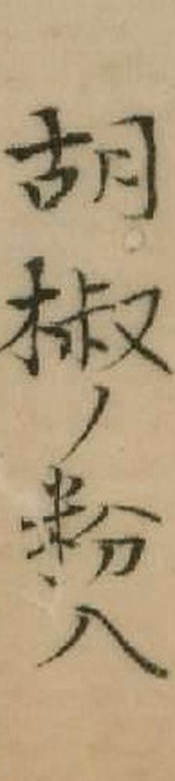胡椒ノ粉入
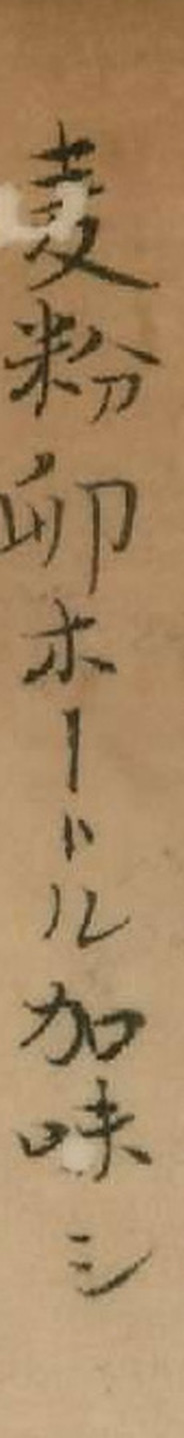麦粉卵ホートル加味シ
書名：和蘭規式料理絵図
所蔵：神戸大学附属図書館 国文学研究資料館
